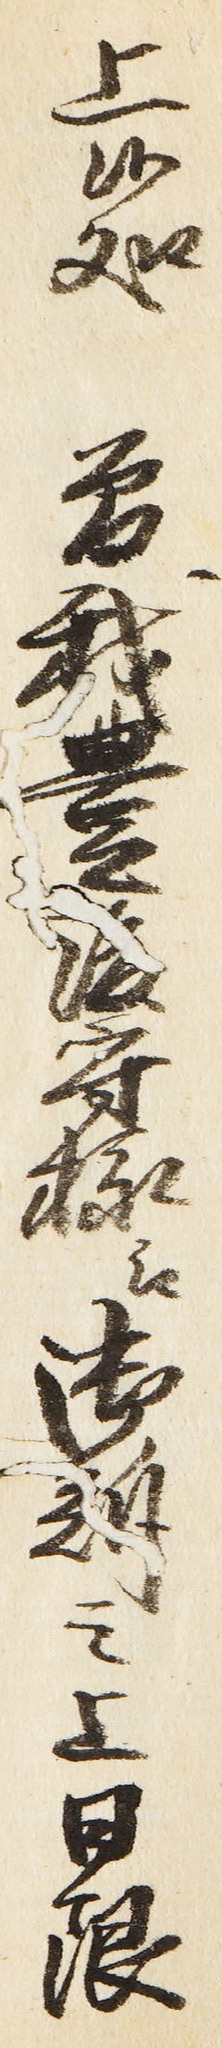上候処曾我豊後守様江御訴之上日限
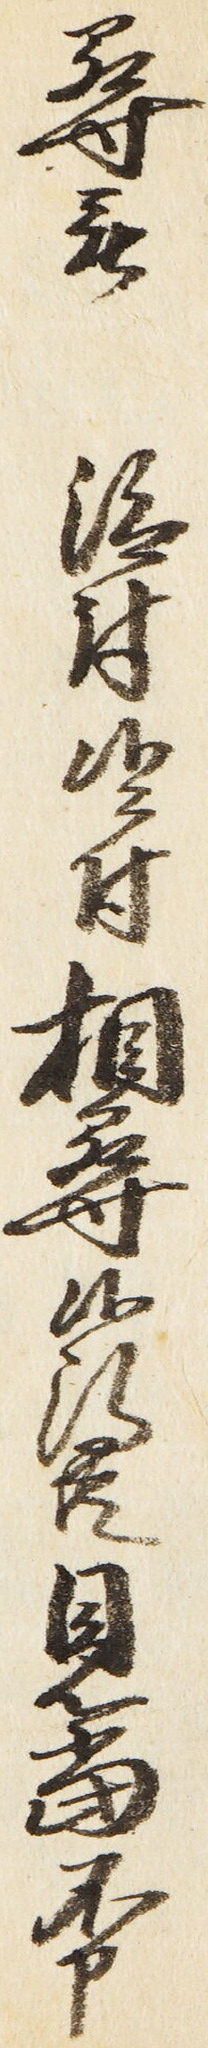尋被仰付候ニ付相尋候得共見当不申
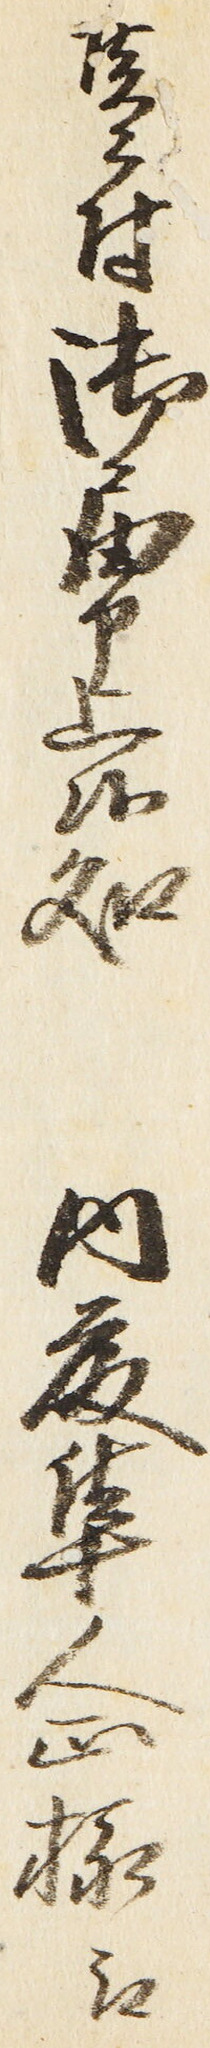候ニ付御届申上候処内藤隼人正様江
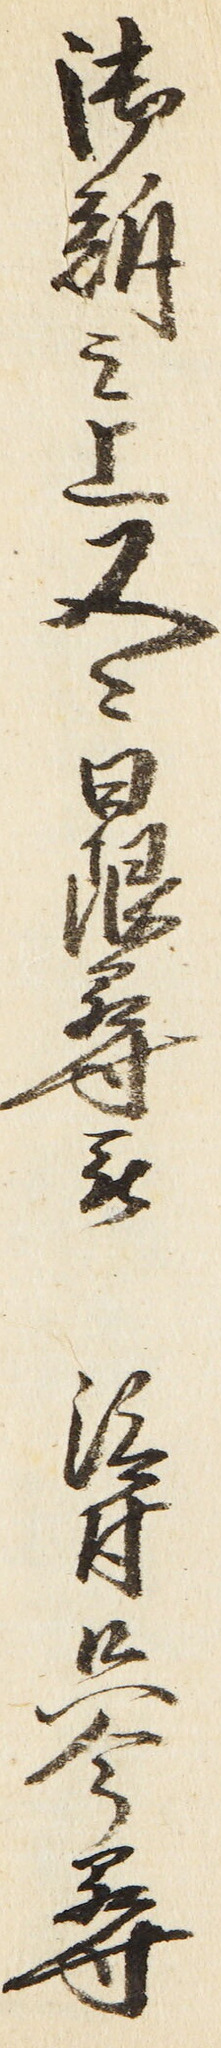御訴之上又々日限尋被仰付只今尋
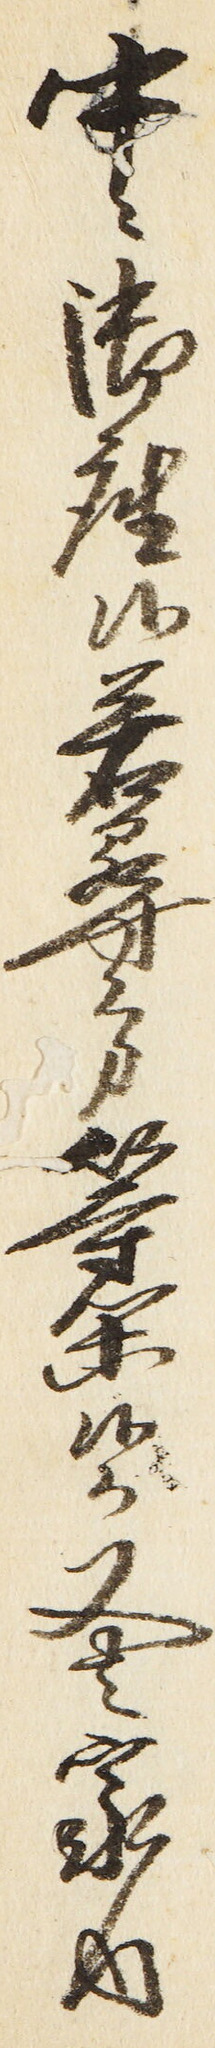中ニ御座候若尋方等閑候か又者家内

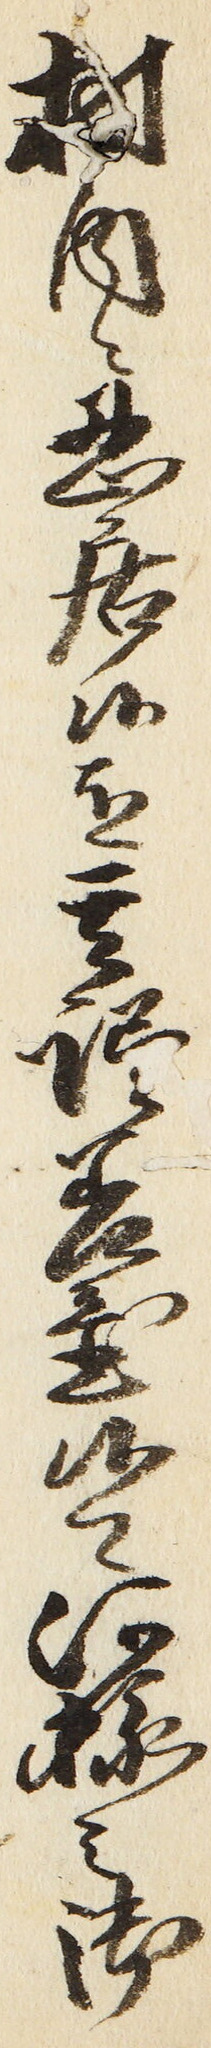村内ニ忍居候を其儘差置候ハヽ何様之御
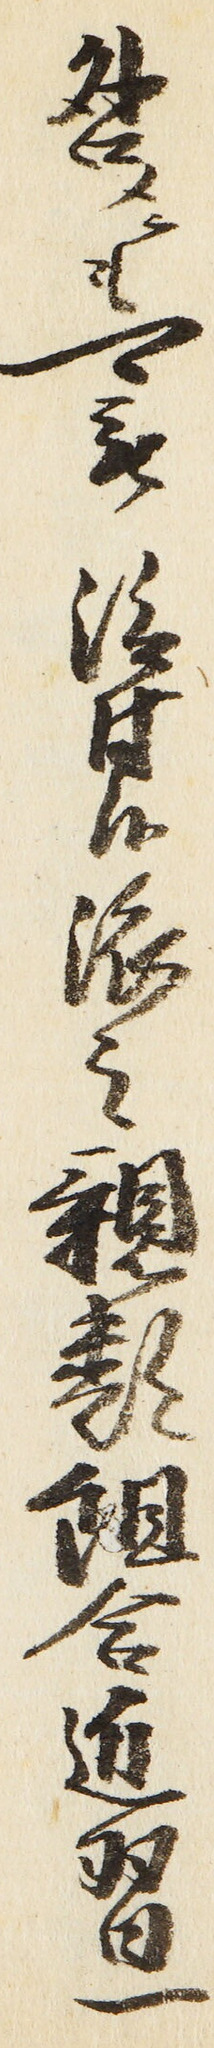咎メニも可被仰付候依之親類組合近習一
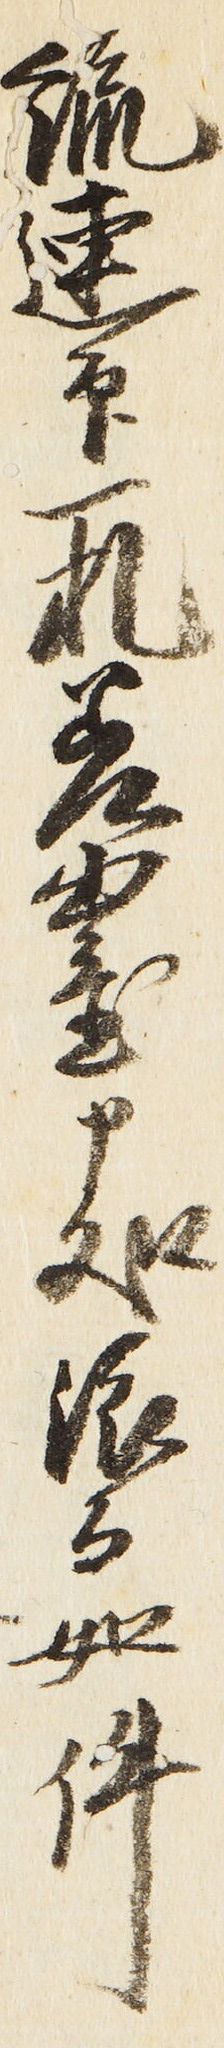統連印一札差出置申処依而如件
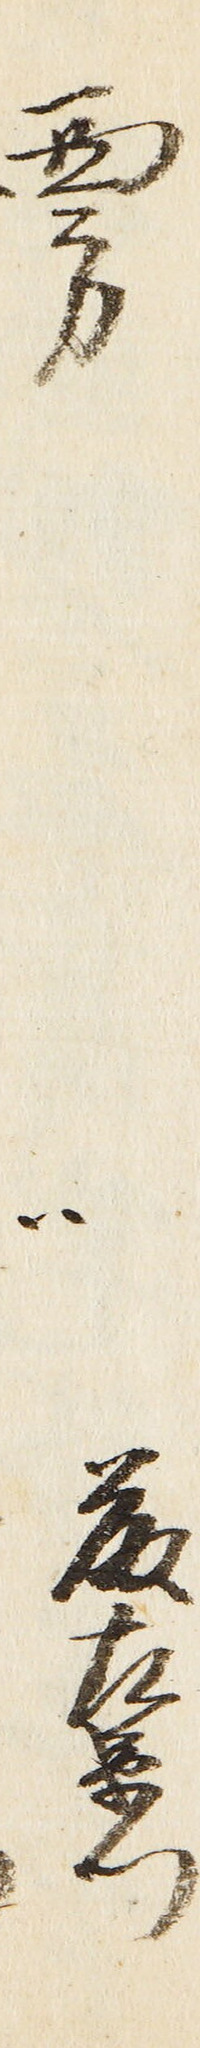同藤左衛門
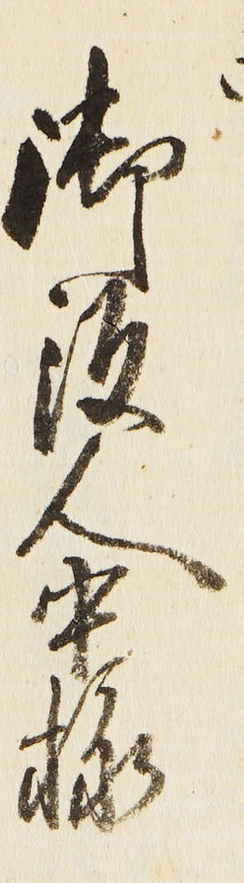御役人中様
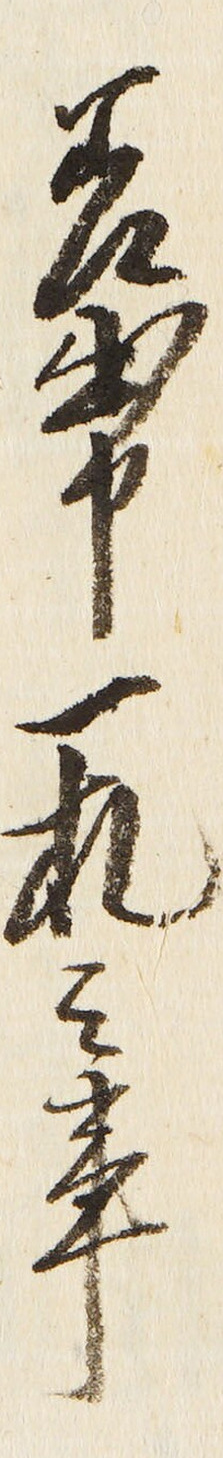差出申一札之事
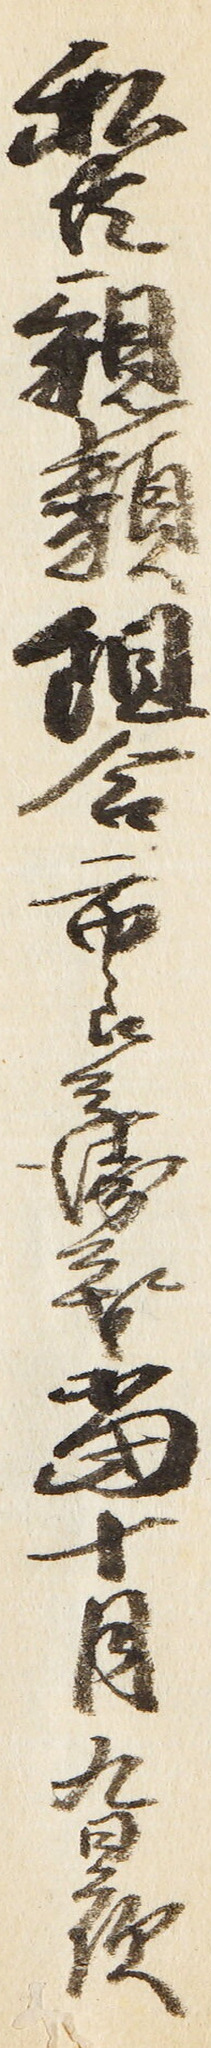一私共親類組合市郎兵衛義当十月九日夜
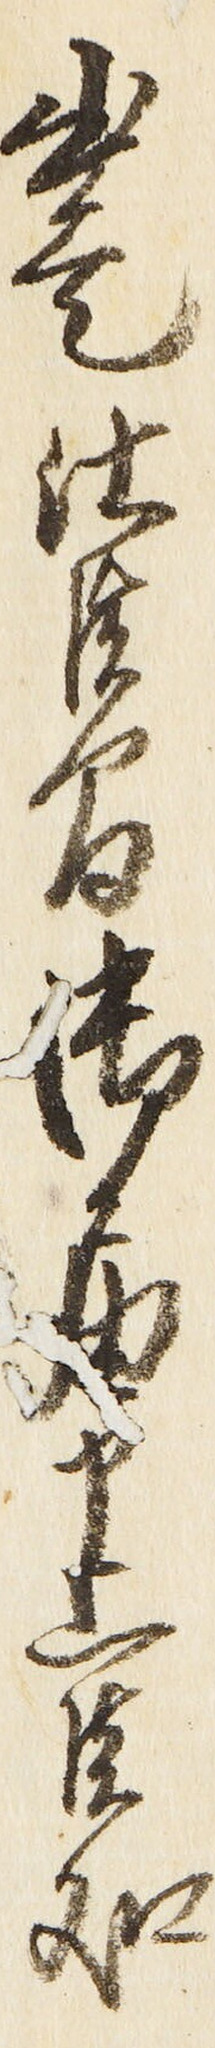出走仕候間御届申上候処
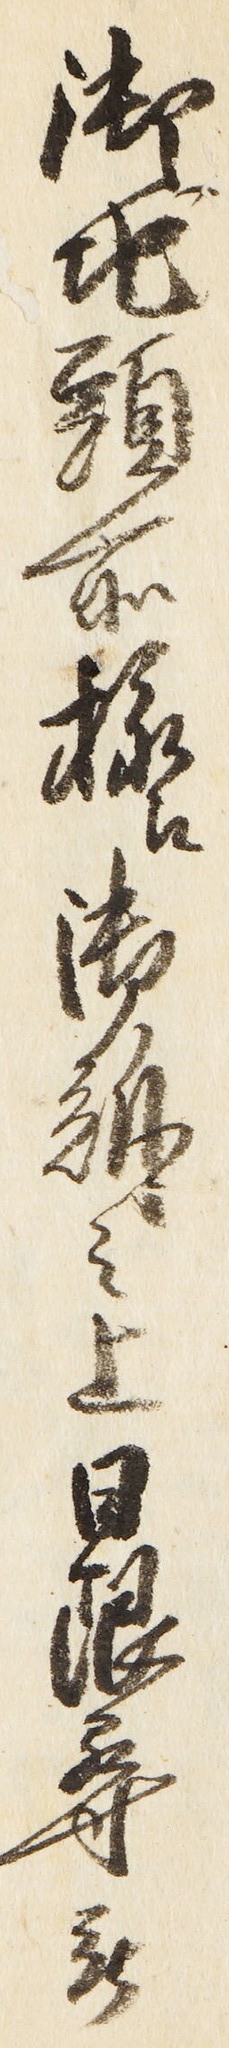御地頭所様江御訴之上日限尋被
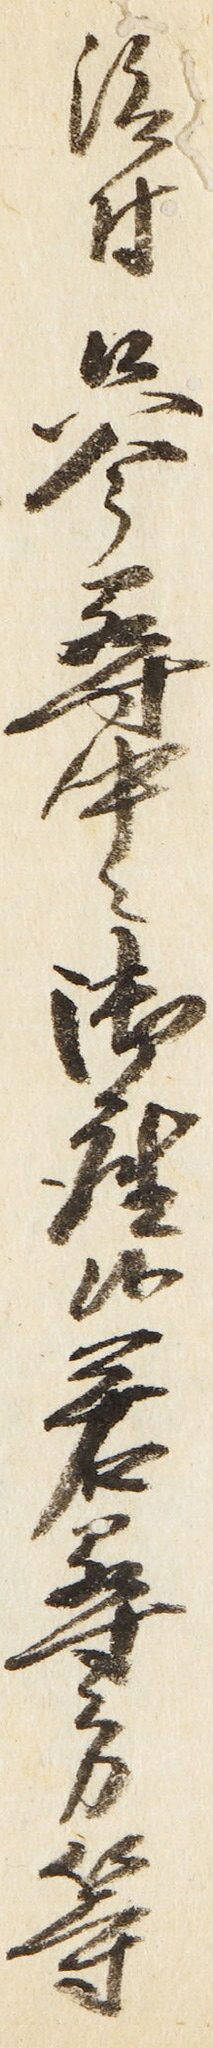仰付只今尋中ニ御座候若尋方等
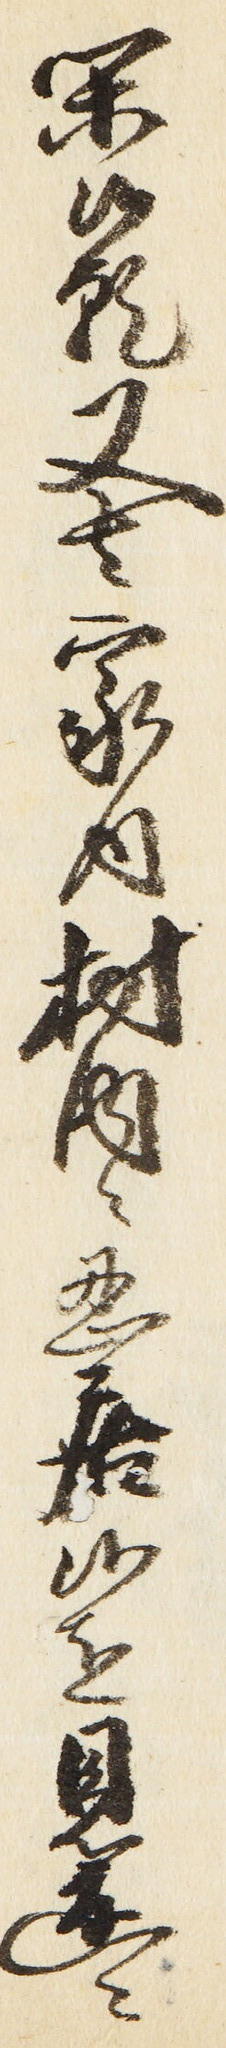閑候歟又者家内村内ニ忍居候を見逃ニ
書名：難船一件記録
